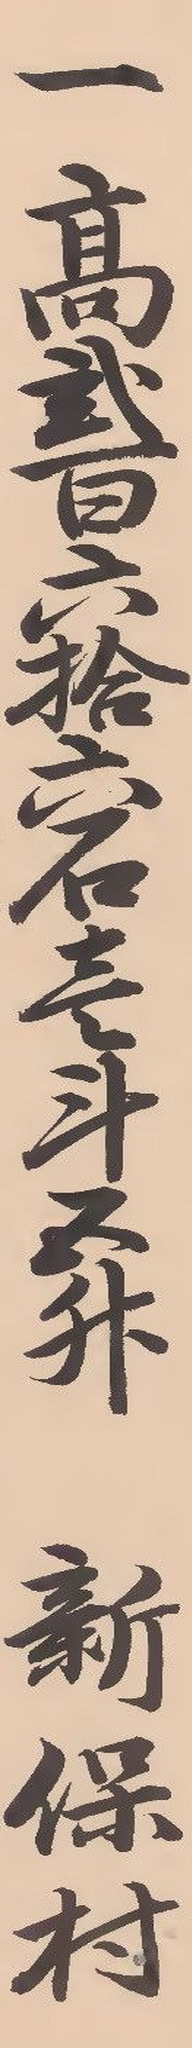一高弐百六拾六石壱斗五升新保村
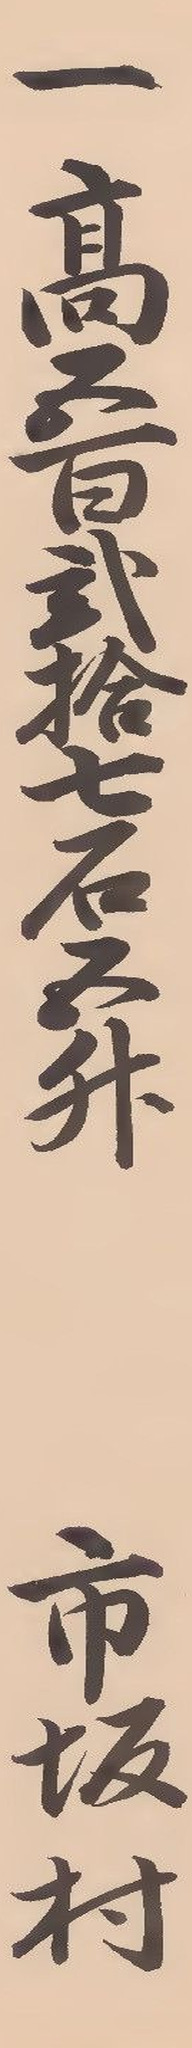一高五百弐拾七石五升市坂村
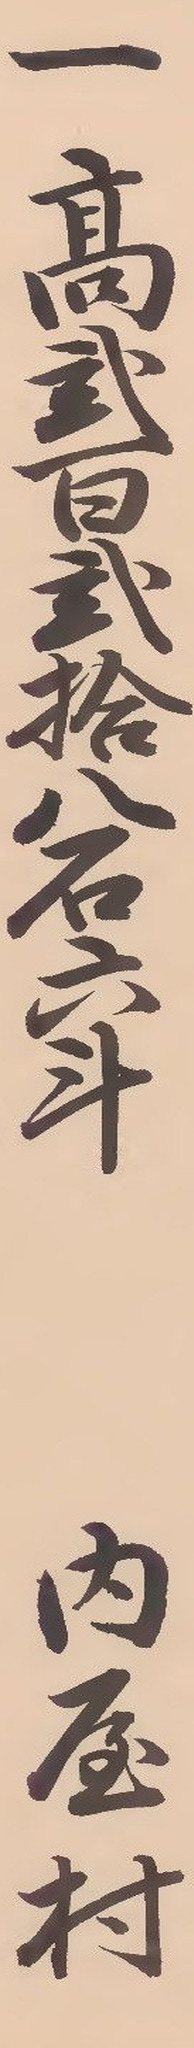一高弐百弐拾八石六斗内屋村

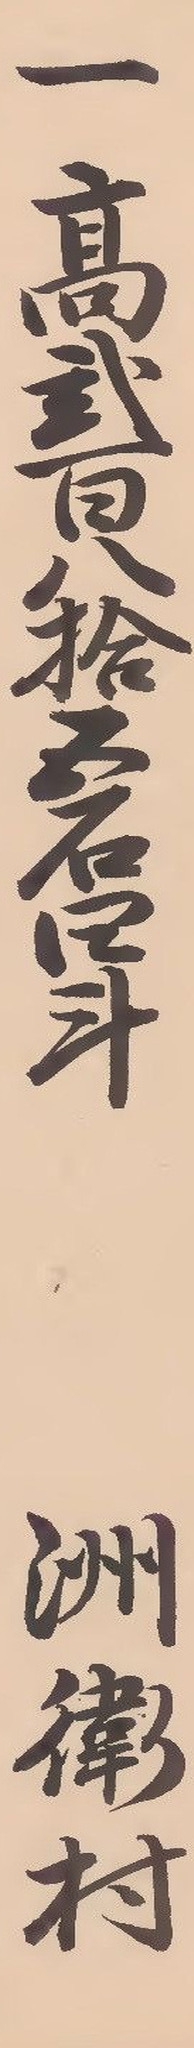一高弐百八拾五石四斗洲衛村
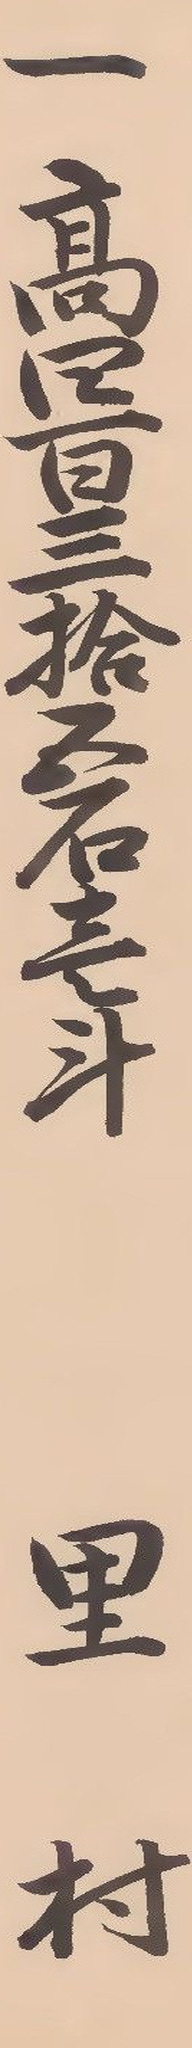一高四百三拾五石壱斗里村
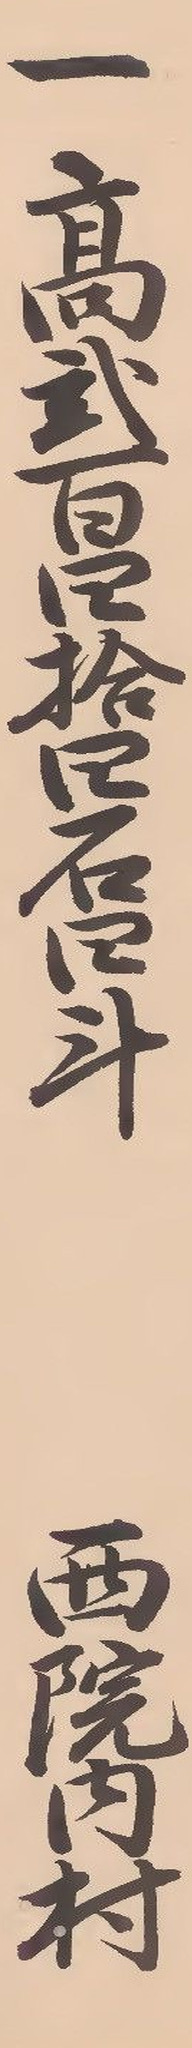一高弐百四拾四石四斗西院内村
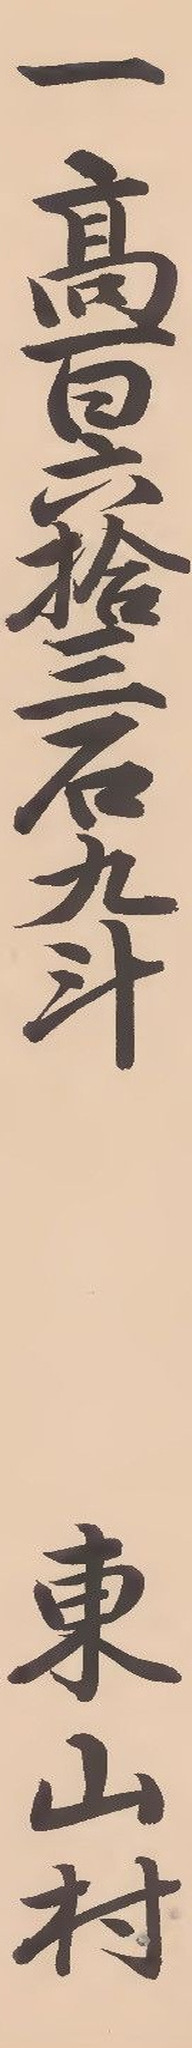一高百六拾三石九斗東山村
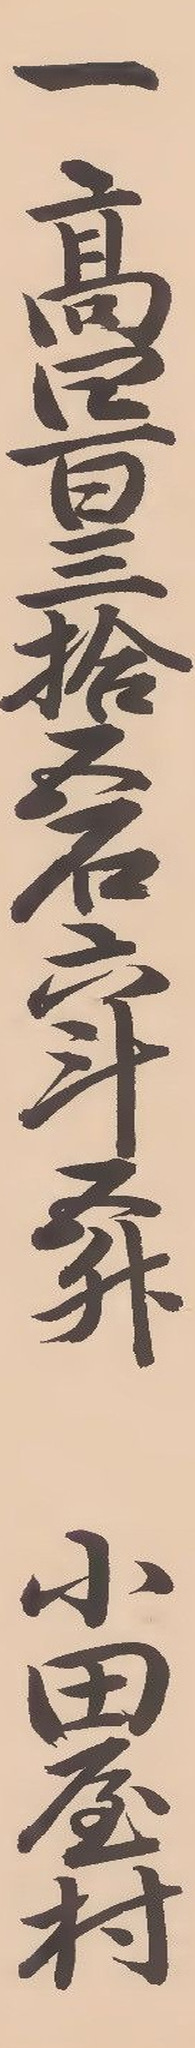一高四百三拾五石六斗五升小田屋村
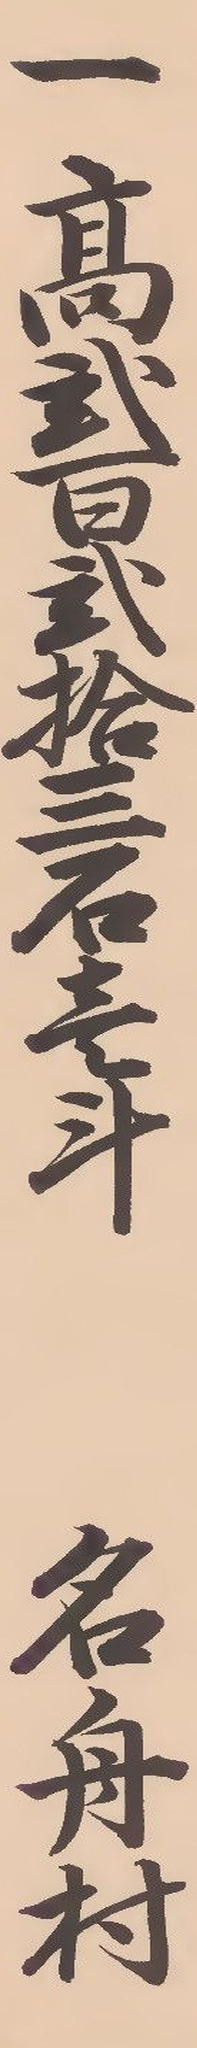一高弐百弐拾三石壱斗名舟村

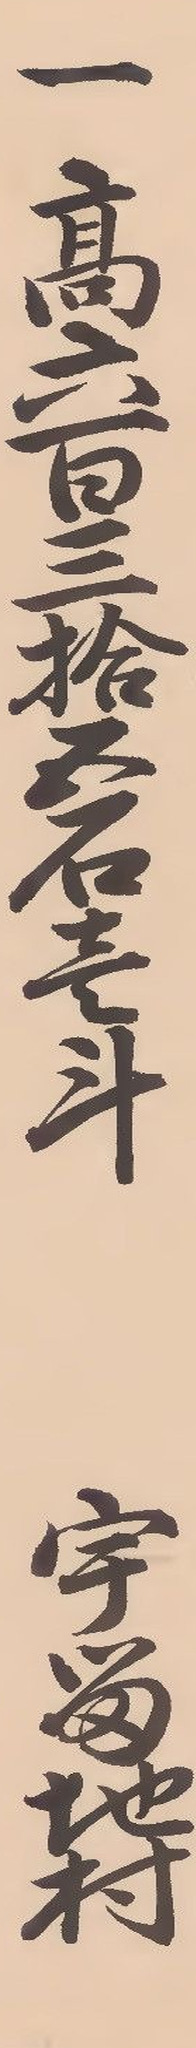一高六百三拾五石壱斗宇留地村
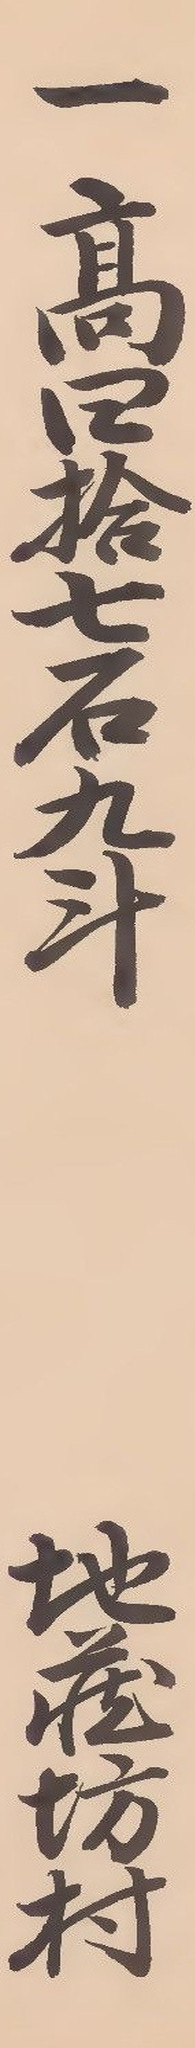一高四拾七石九斗地蔵坊村

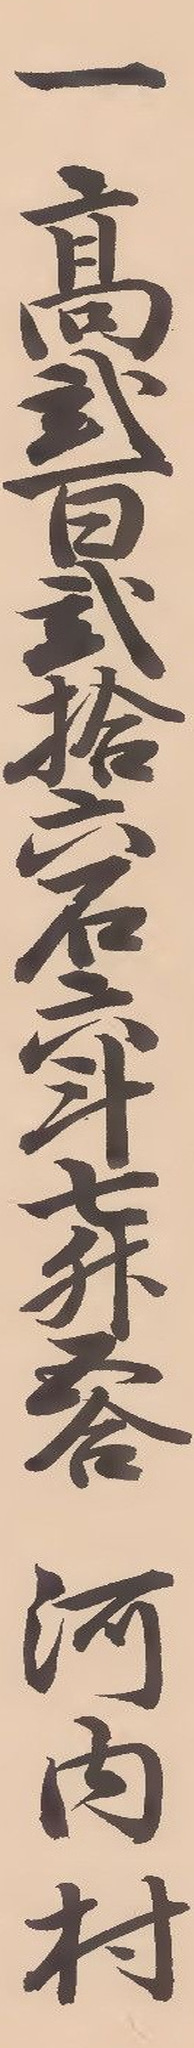一高弐百弐拾六石六斗七升五合河内村
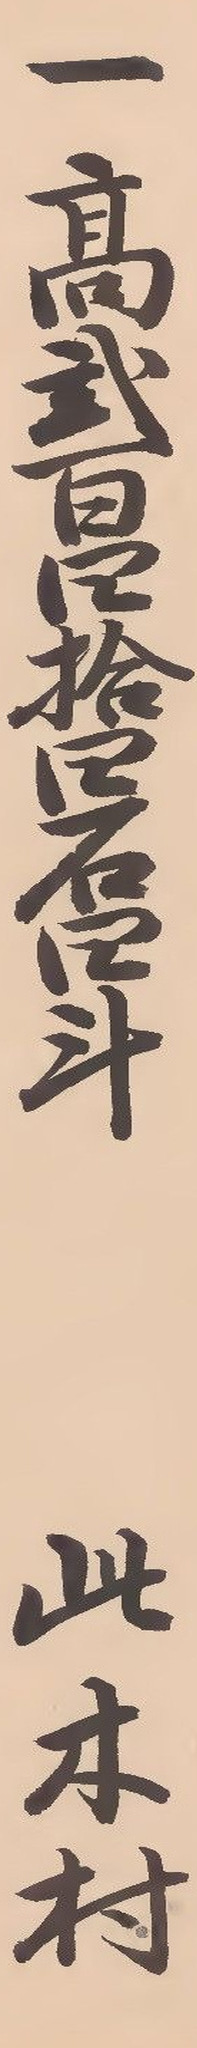一高弐百四拾四石四斗此木村
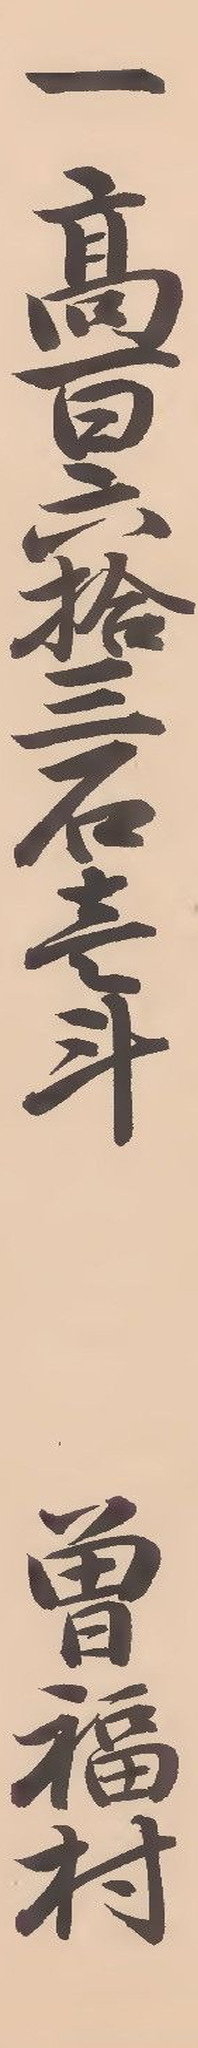一高百六拾三石壱斗曽福村
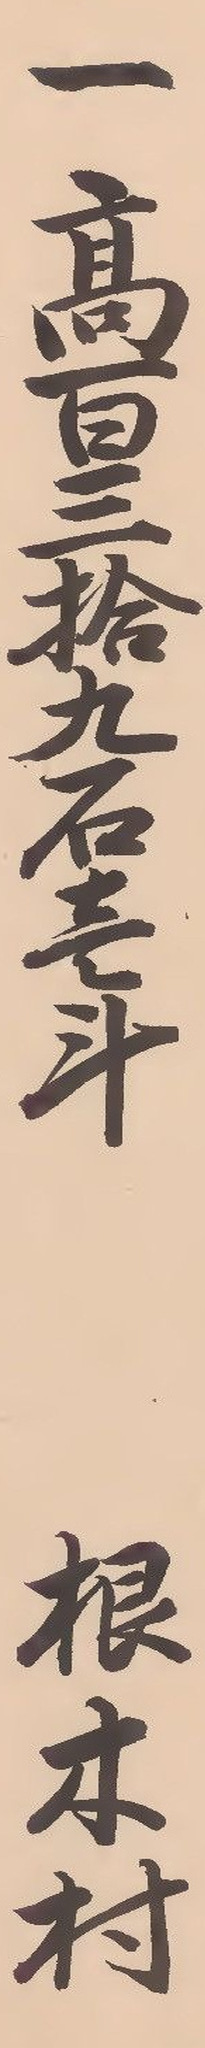一高百三拾九石壱斗根木村
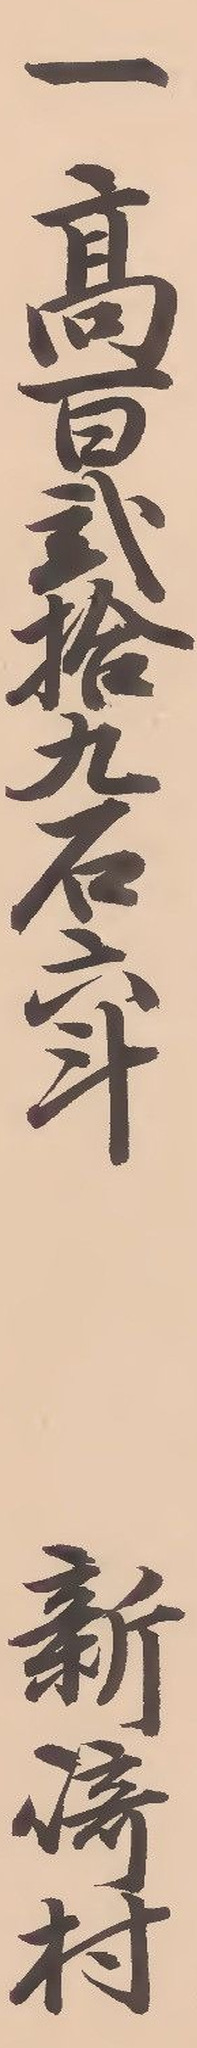一高百弐拾九石六斗新崎村
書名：能登国郷帳
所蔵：国立公文書館 National Archives of Japan
